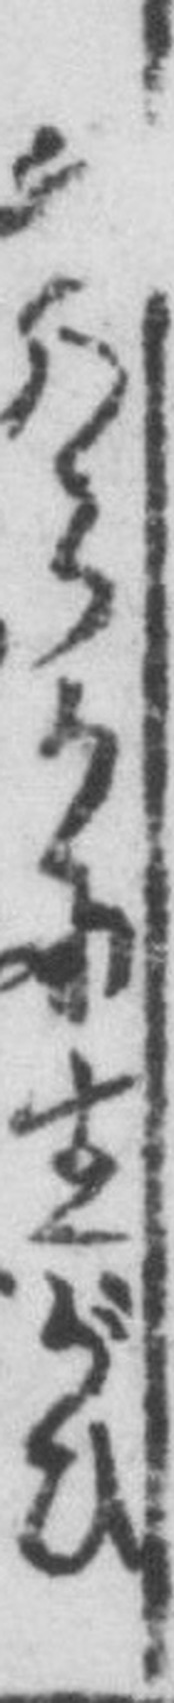やハらかに生がひ
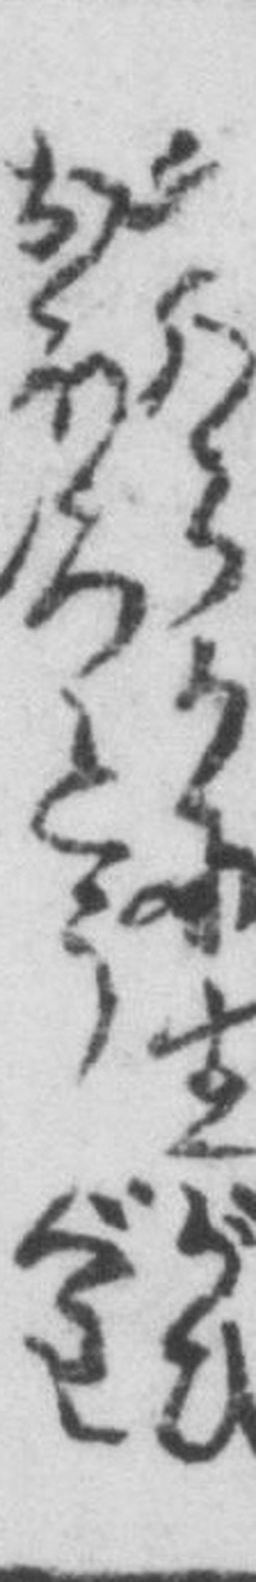おほろとうぶ
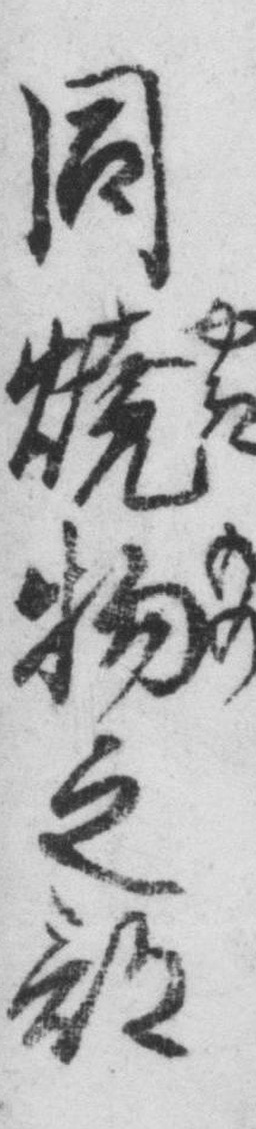同焼物之部
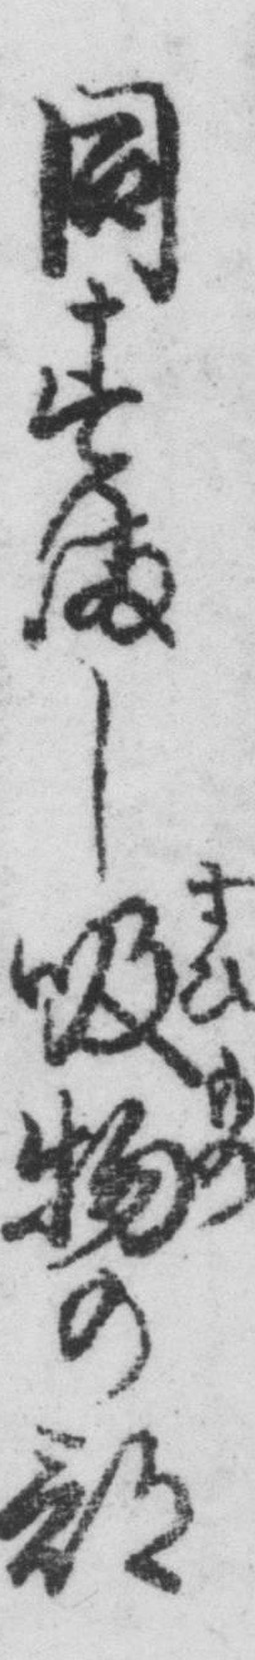同すまし吸物の部
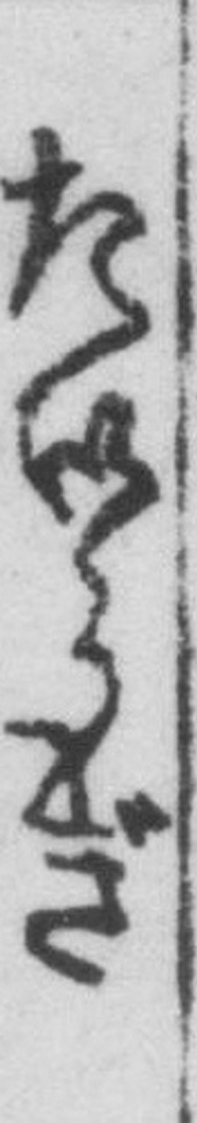たいらぎ
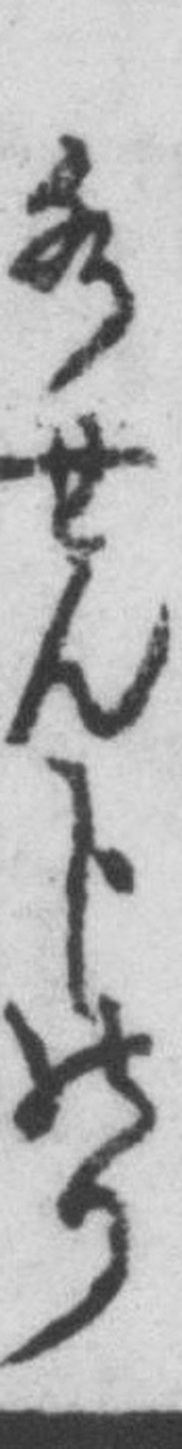水せんじのり
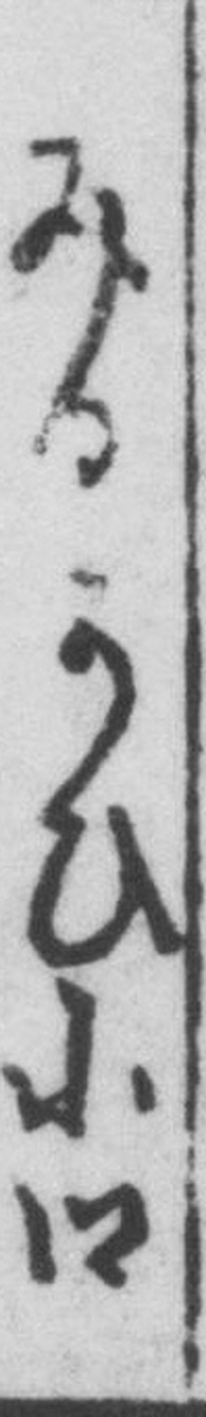みるかひ小口
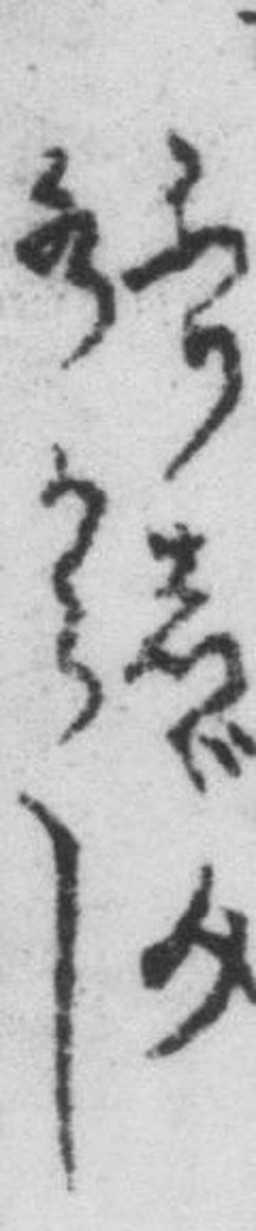水からし
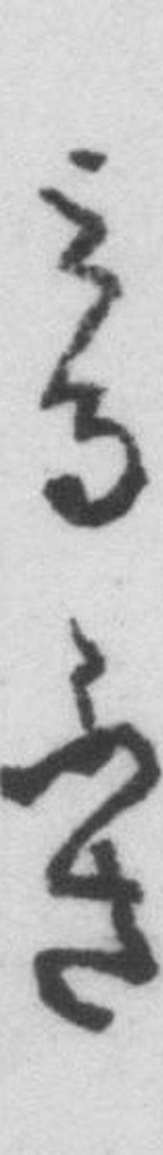ミるふさ
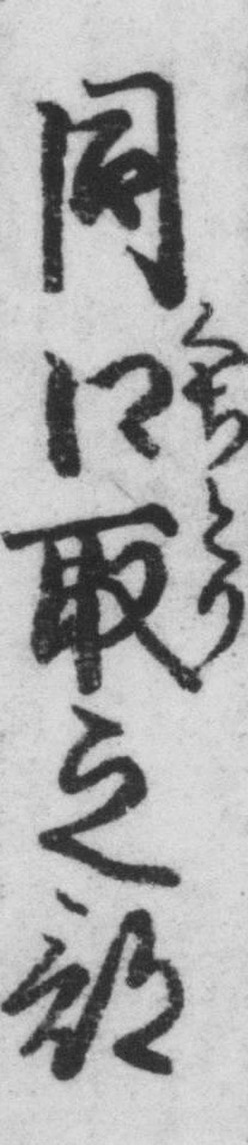同口取之部
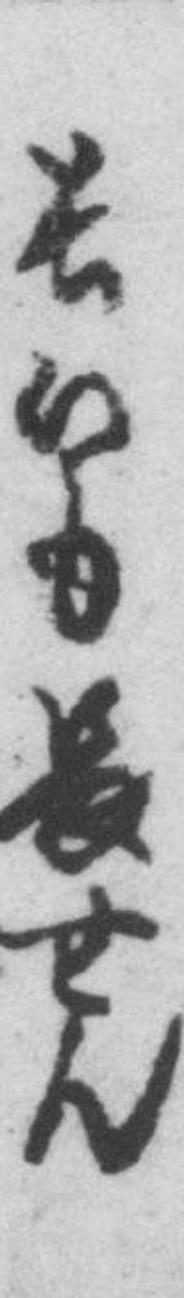長いも長せん
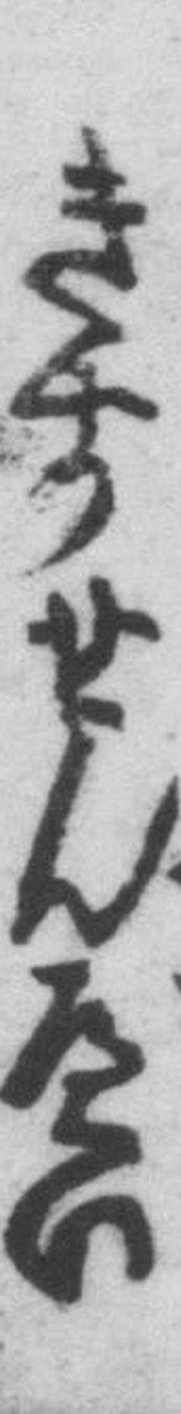きすせんへい
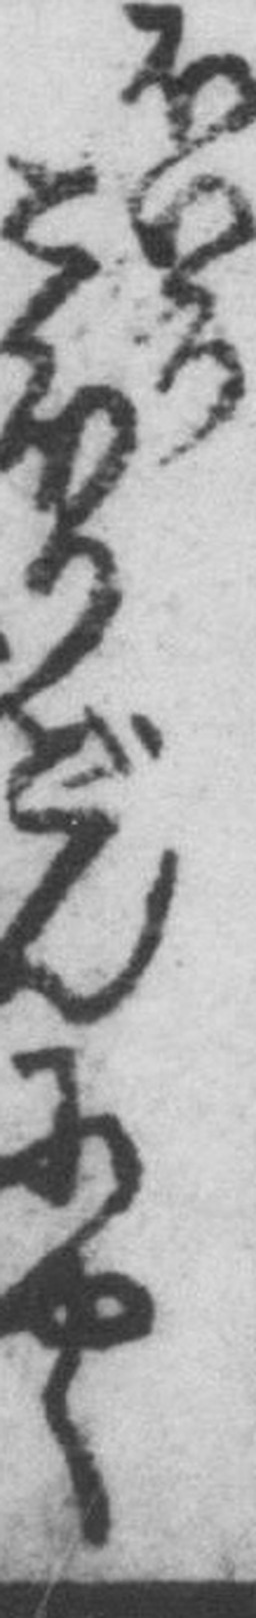こほりごんにやく
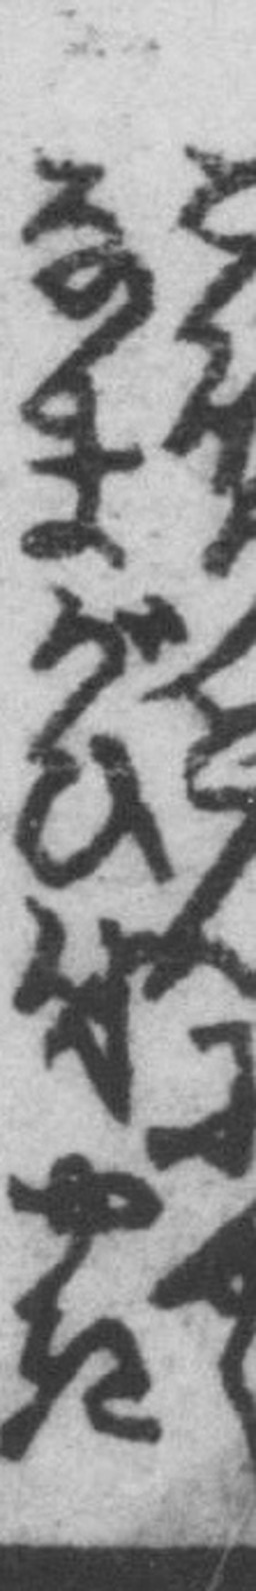なまがひ付やき

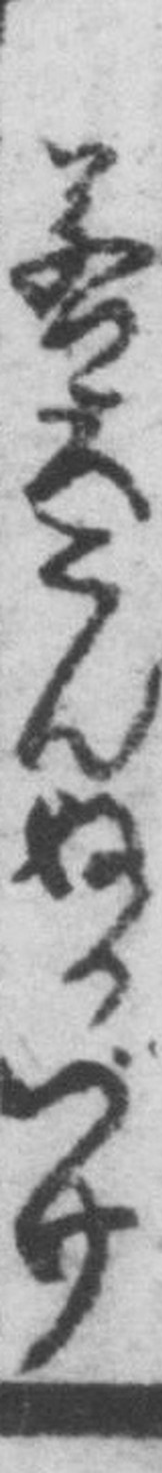葉大こんぬかづけ
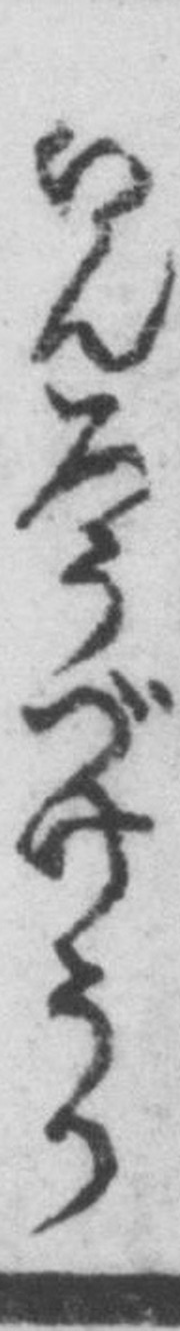いんろうづけうり
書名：即席庖丁
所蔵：大阪府立大学学術情報センター 国文学研究資料館
